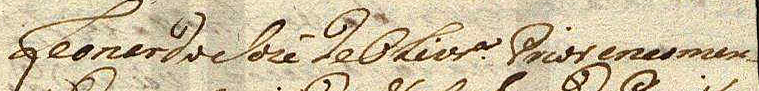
Leonardo Iozé de OLivr.a Prior encomen
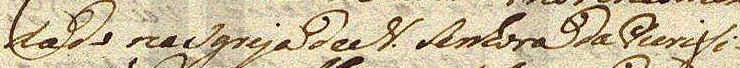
dado na Igreja de N. Senhora da Purifi
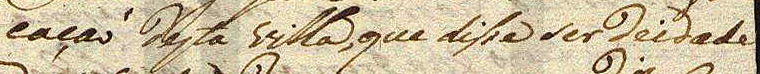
caçaõ desta villa, que disse ser de idade
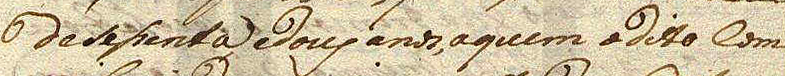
de sessenta e dous anos, a quem o dito Com
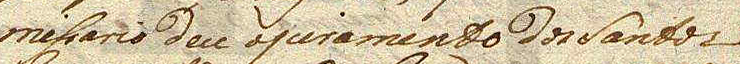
missario deu o juramento dos Santos
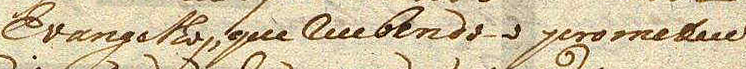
Evangelhos, que Recebendo-o prometeu
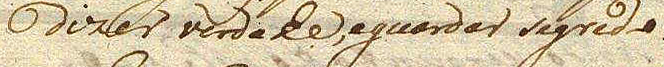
dizer verdade, e guardar segredo.
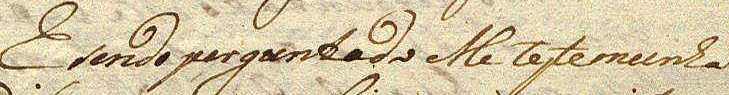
E sendo perguntado elle testemunha
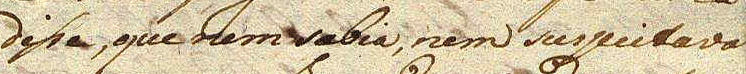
disse, que nem sabia, nem suspeitava
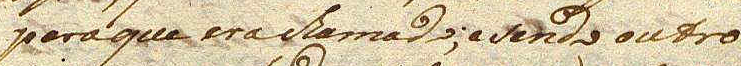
para que era chamado; e sendo outro
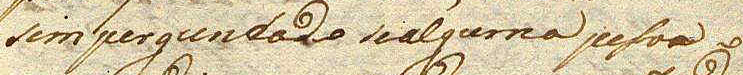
sim perguntado se alguma pessoa o
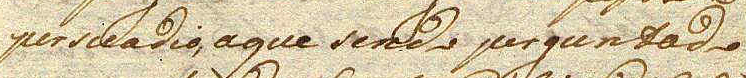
persuadio, a que sendo perguntado
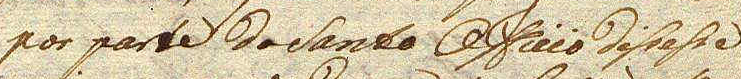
por parte do Santo Officio dissesse
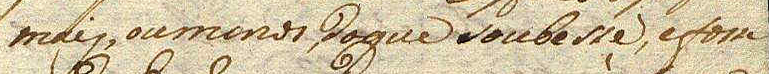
mais, ou menos, do que soubesse, e fosse
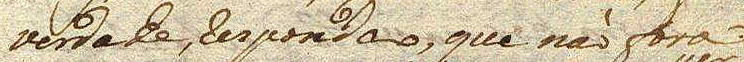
verdade, Respondeo, que naõ fora
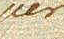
per
